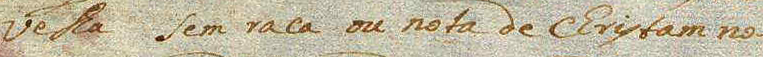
Velha sem raca ou nota de Christam no
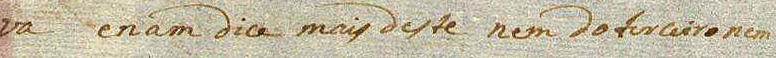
va e nam dice mais deste nem do terceiro nem
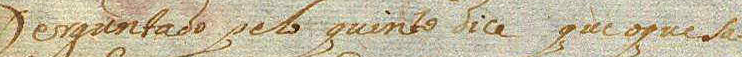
Perguntado pelo quinto dice que o que sa
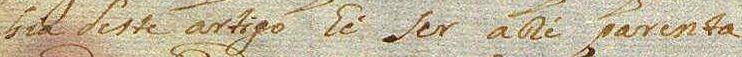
bia deste artigo hé ser a Ré parenta
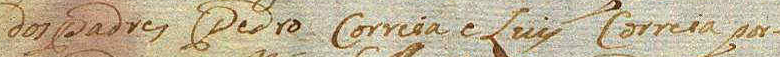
dos padres Pedro Correia e Luis Correia por
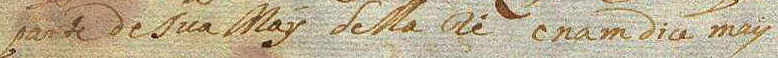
parte de sua May della Ré e nam dice mais
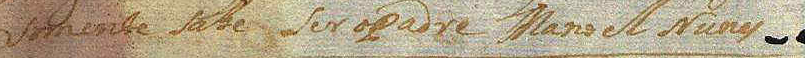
somente sabe ser o padre Manoel Nunes
